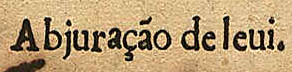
Abjuração de leui.
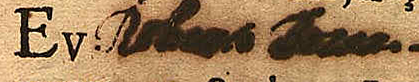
EV. Roberto Boier
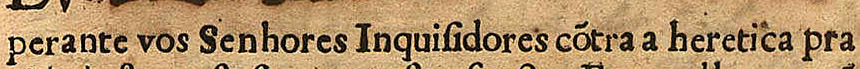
perante vos Senhores Inquisidores cōtra a heretica pra
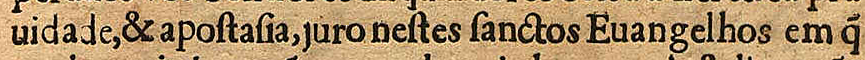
uidade, & apostasia, juro nestes sanctos Euangelhos em q̄
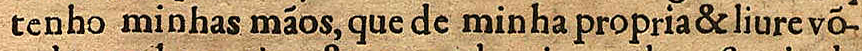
tenho minhas mãos, que de minha propria & liure vō
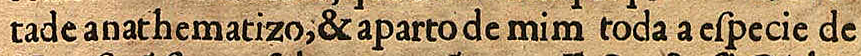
tade anathematizo, & aparto de mim toda a especie de
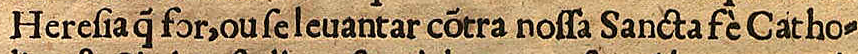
Heresia q̄ for, ou se leuantar cōtra nossa Sancta fè Catho
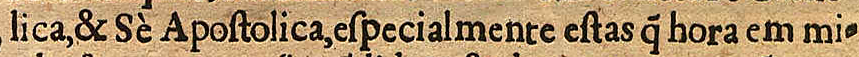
lica, & Sè Apostolica, especialmente estas q̄ hora em mi
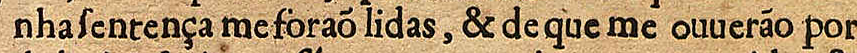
nha sentença me foraõ lidas, & de que me ouuerão por
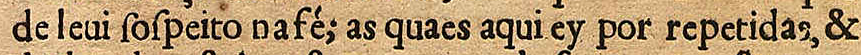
de leui sospeito na fé; as quaes aqui ey por repetidas, &
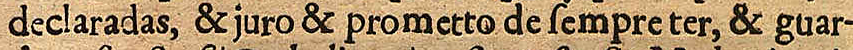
declaradas, & juro, & prometto de sempre ter, & guar
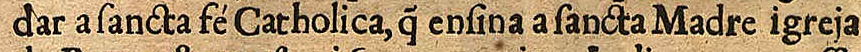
dar a sancta fé Catholica, q̄ ensina a sancta Madre igreja
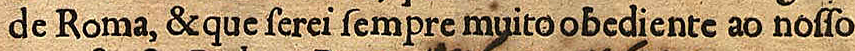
de Roma, & que serei sempre muito obediente ao nosso
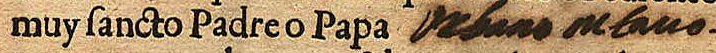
muy sancto Padre o Papa Vrbano outauo
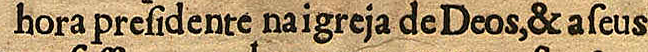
hora presidente na igreja de Deos, & a seus
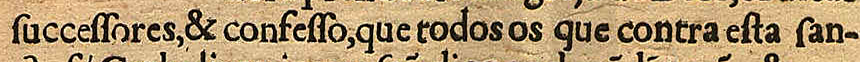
successores, & confesso, que todos os que contra esta san
